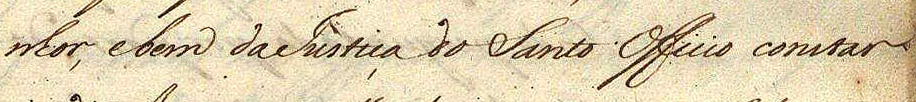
nhor, e bem da Iustiça do Santo Officio constar
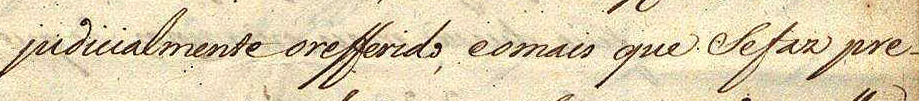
judicialmente o refferido, e o mais que Se faz pre
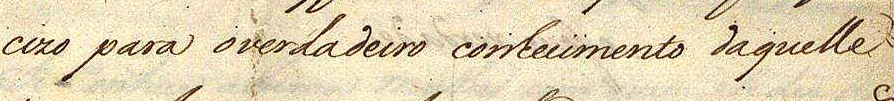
cizo para o verdadeiro conhecimento daquelle
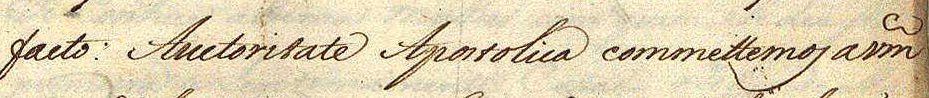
facto: Auctoritate Apostolica commettemos a v m.ce
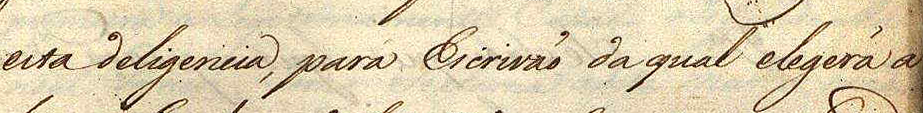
esta deligencia, para Escrivaõ da qual elegerá a
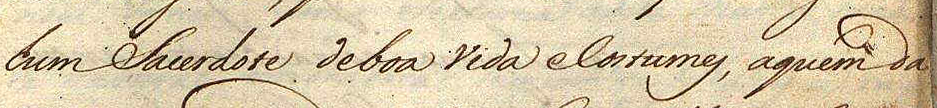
hum Sacerdote de boa vida, e Costumes, a quem da
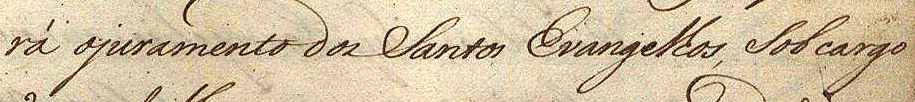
rá o juramento doz Santos Evangelhos, Sob cargo
